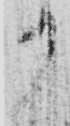人
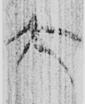大
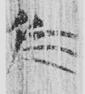於
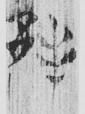邦
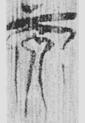而
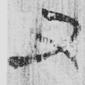又（有）
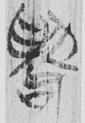○（劬）
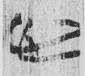心
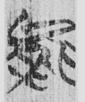能
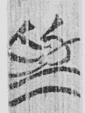爲
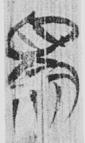○（鬼）
